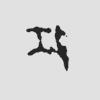攻
